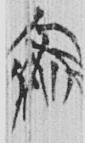衰
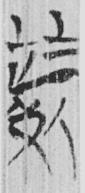○（亡）
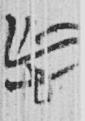忘
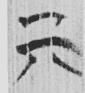亓（其）
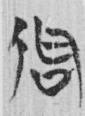佝
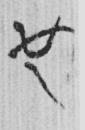也
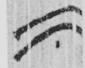二
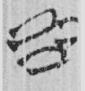厽（三）
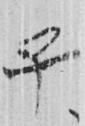子
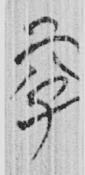○（勉）
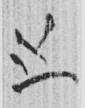之
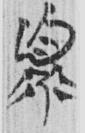○（寡）
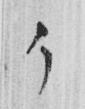人
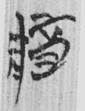𨟻（將）
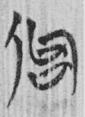佝
